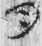月
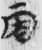丙
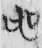申
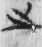之
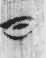日
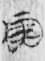霝（靈）
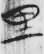里
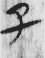子
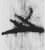之
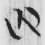州
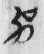加
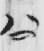公
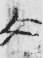文
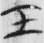壬
